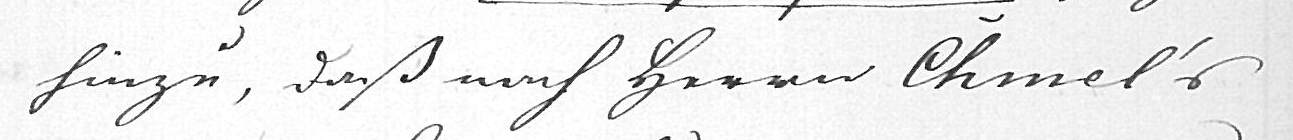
hinzu, daß nach Herrn Chmel's
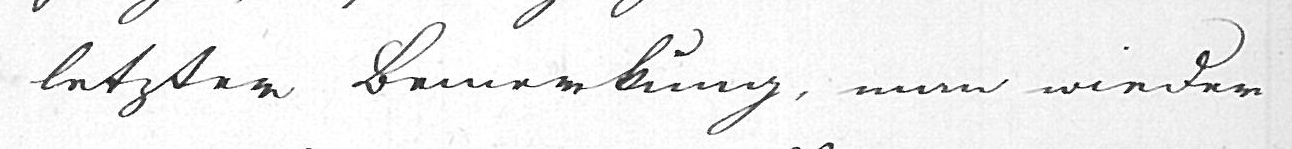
letzter Bemerkung, man wieder
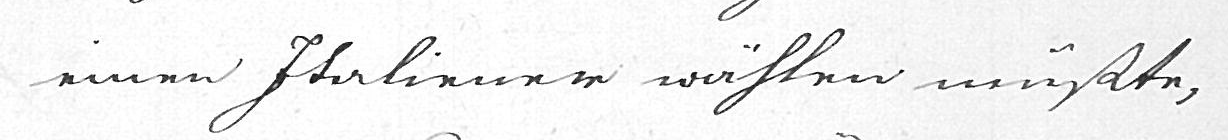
einen Italiener wählen müßte,
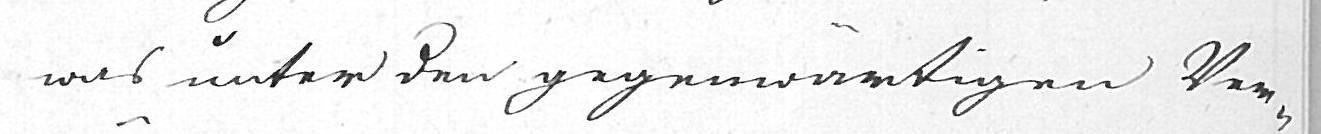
was unter den gegenwärtigen Ver-
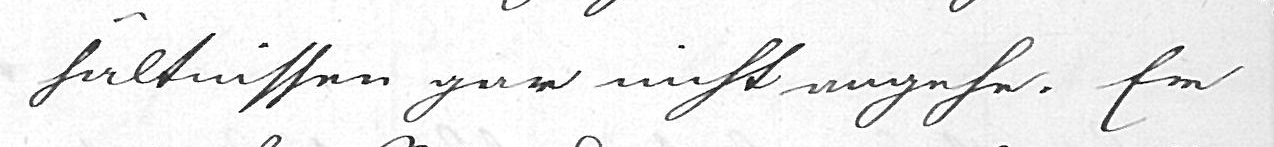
hältnissen gar nicht angehe. Er
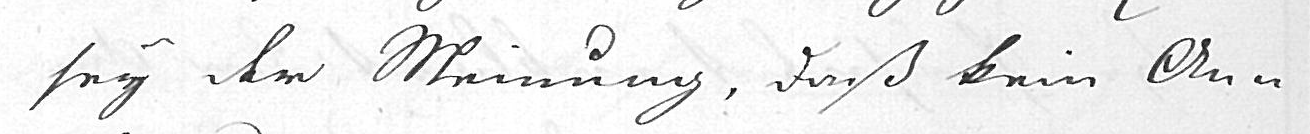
sey der Meinung, daß kein An-
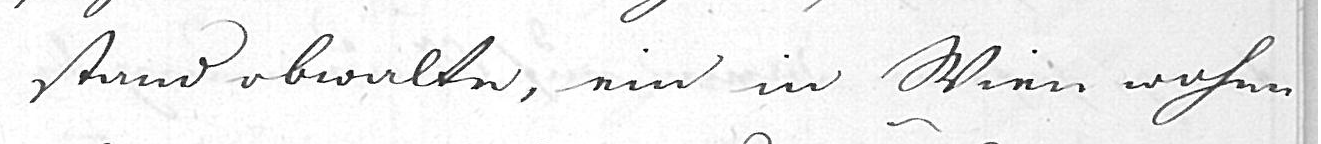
stands obwalte, ein in Wien wohn-
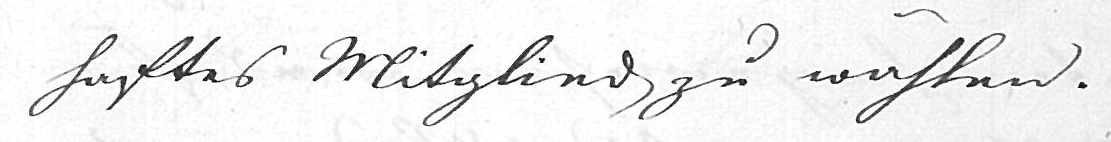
haftes Mitglied zu wählen.
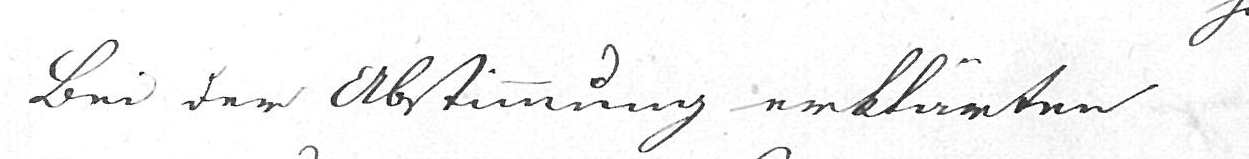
Bei der Abstimmung erklärten
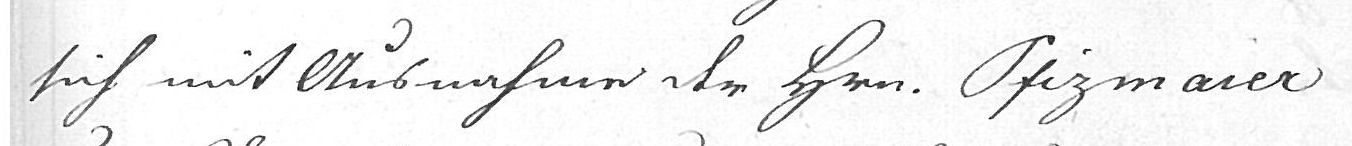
sich mit Ausnahme der Hrn. Pfizmaier
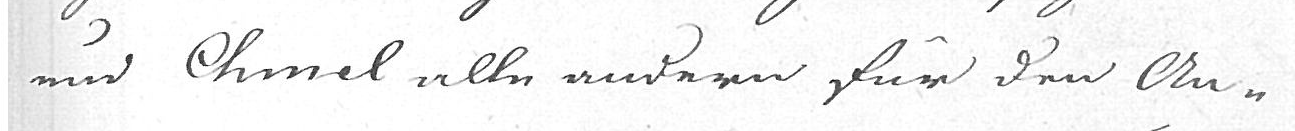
und Chmel alle andern für den An-
